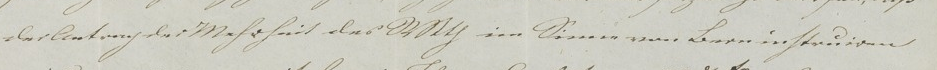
der Antrag der Mehrheit des RRth im Sinne von Bern instruiren
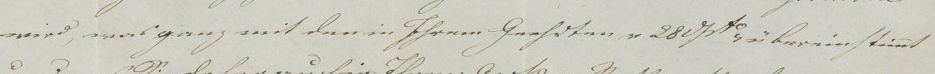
wird, was ganz mit den in Ihrem Geehrten v 28dpto übereinstimmt
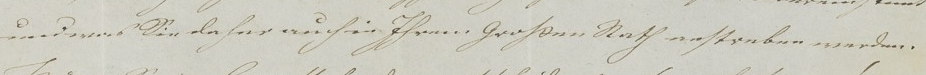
und was Sie daher auch in Ihrem Großen Rath anstreben werden.
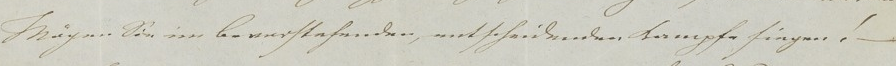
Mögen Sie im bevorstehenden, entscheidenden Kampfe siegen! ­
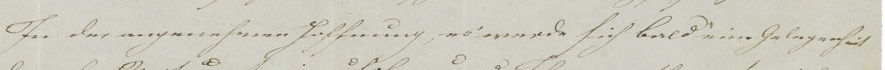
In der angenehmen Hoffnung, es werde sich bald eine Gelegenheit
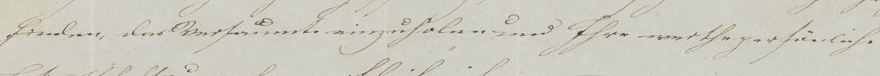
finden, das Versäumte einzuholen und Ihre werthe persönliche
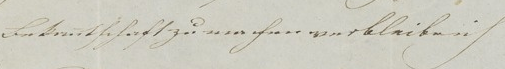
Bekanntschaft zu machen verbleibe ich
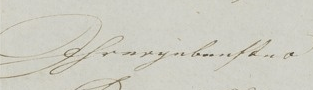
Ihr ergebenster
